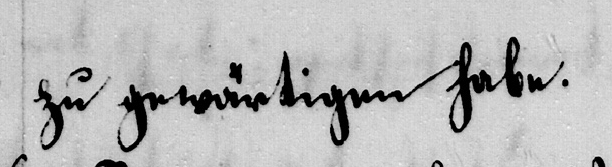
zu gewärtigen habe.
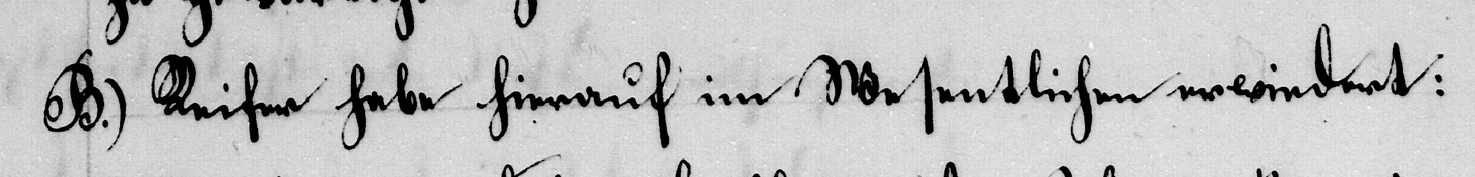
B.) Reifer habe hierauf im Wesentlichen erwiedert:
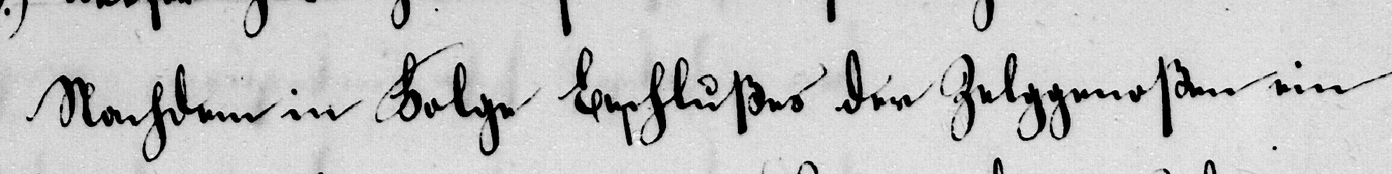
Nachdem in Folge Beschlußes der Zelggenoßen ein
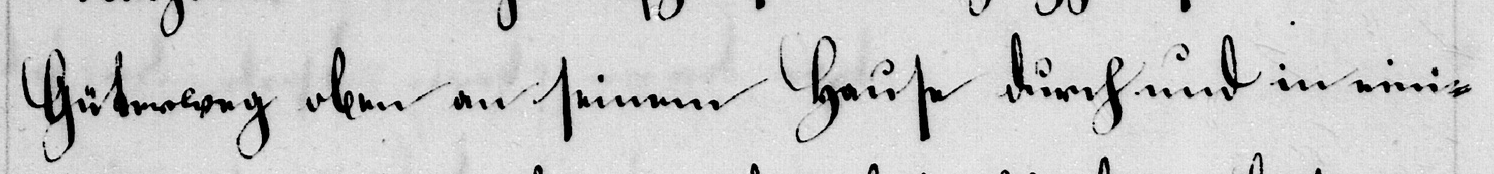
Güterweg oben an seinem Hause durch und in eini¬
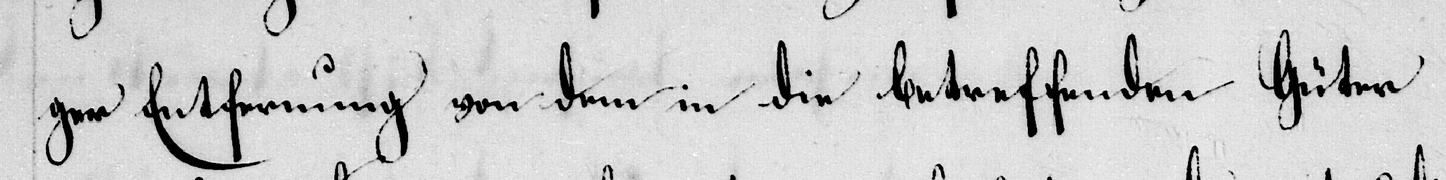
ger Entfernung von dem in die betreffenden Güter
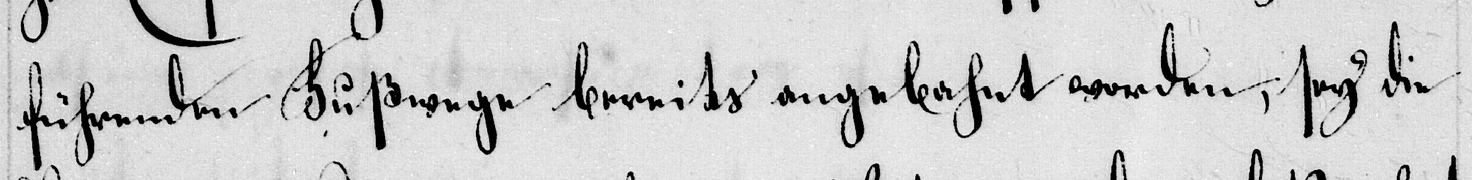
führenden Fußwege bereits angebahnt worden, sey die
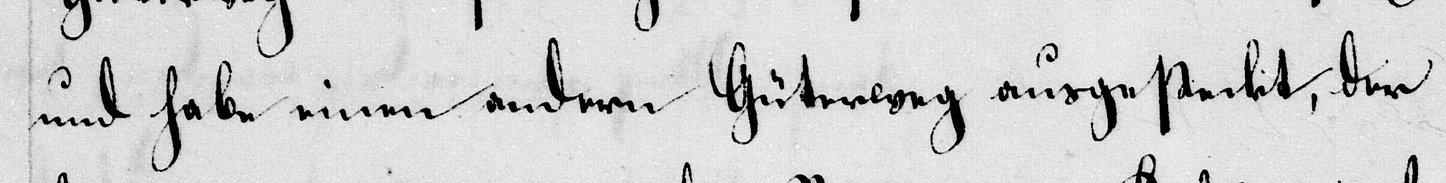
und habe einen andern Güterweg ausgesteckt, der
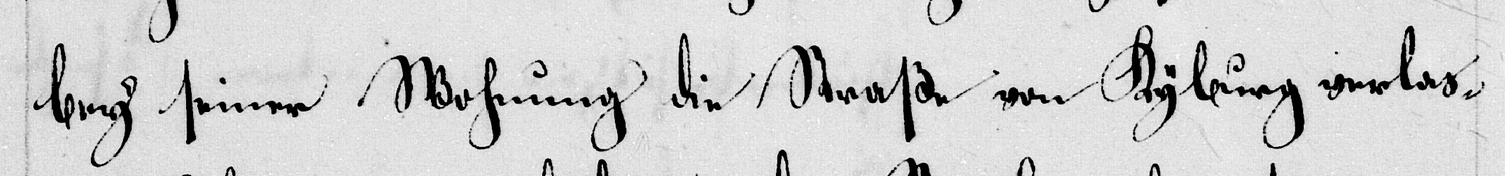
bey seiner Wohnung die Straße von Kyburg verlaß¬
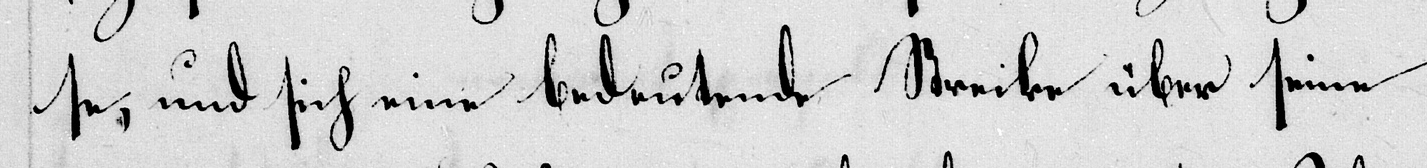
e, und sich eine bedeutende Strecke über seine
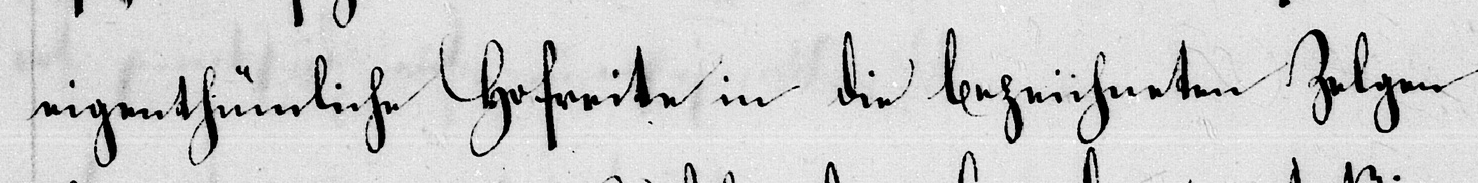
eigenthümliche Hofreite in die bezeichneten Zelgen
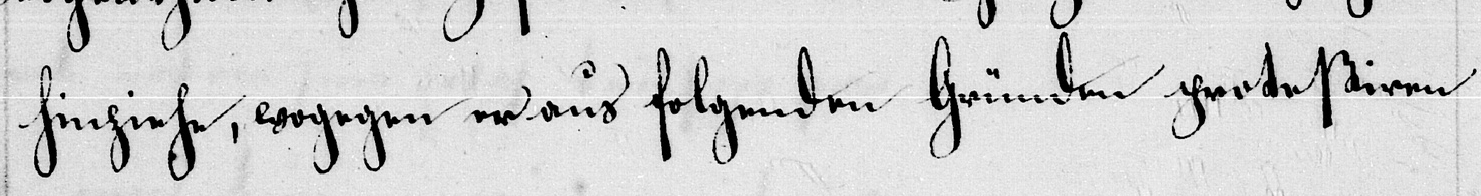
hinziehe, wogegen er aus folgenden Gründen protestiren
